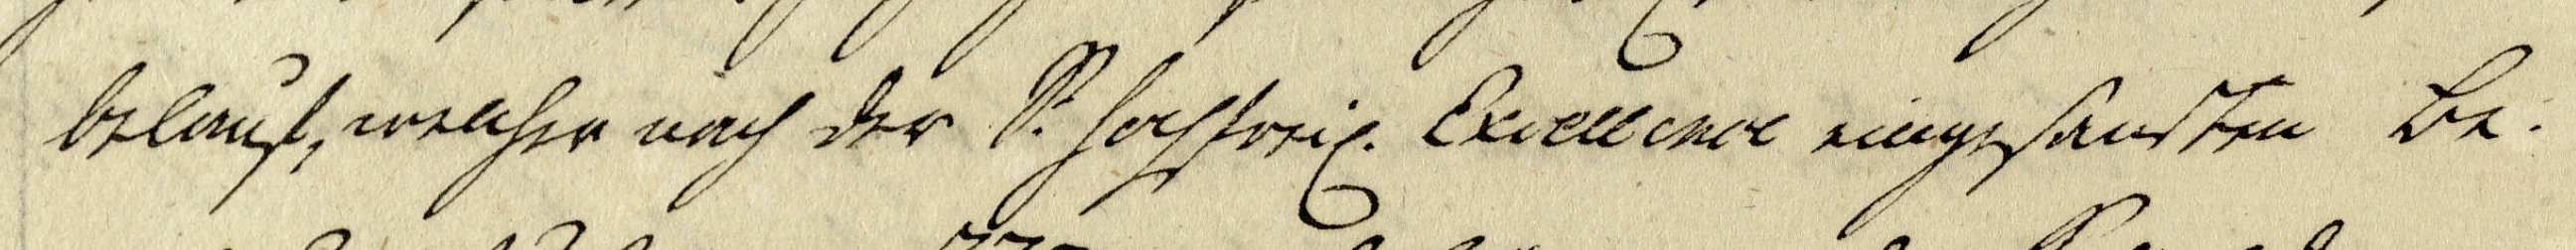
belauf, welcher nach der Sr. Hochfrei. Excellence eingesandten Be¬
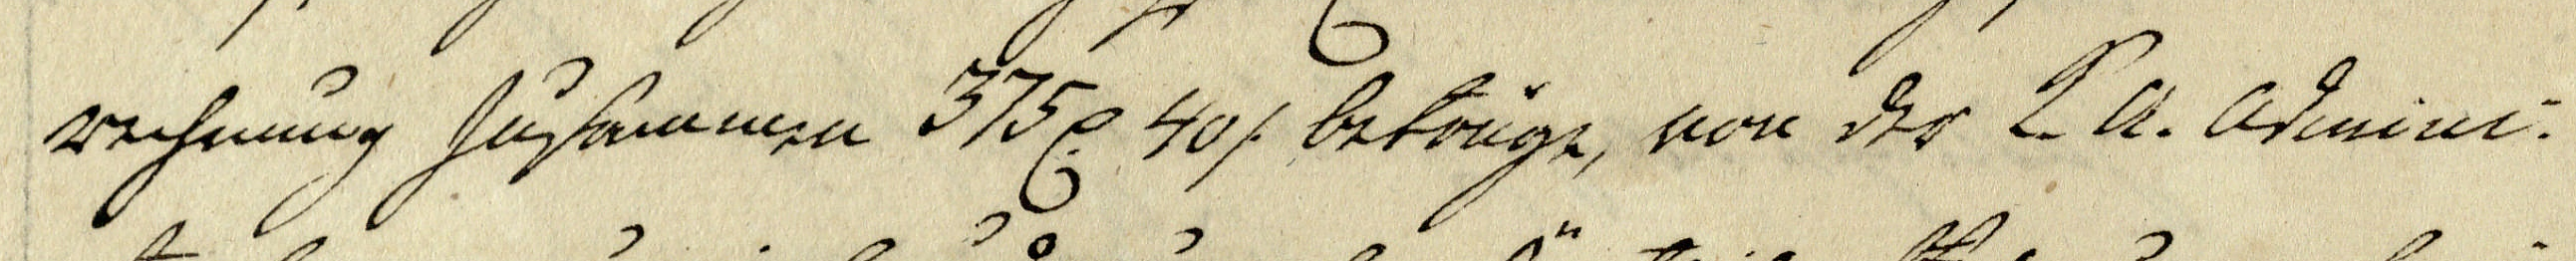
rechnung zusammen 375 l. 40 s. betrüge, von der K . A. Admini¬
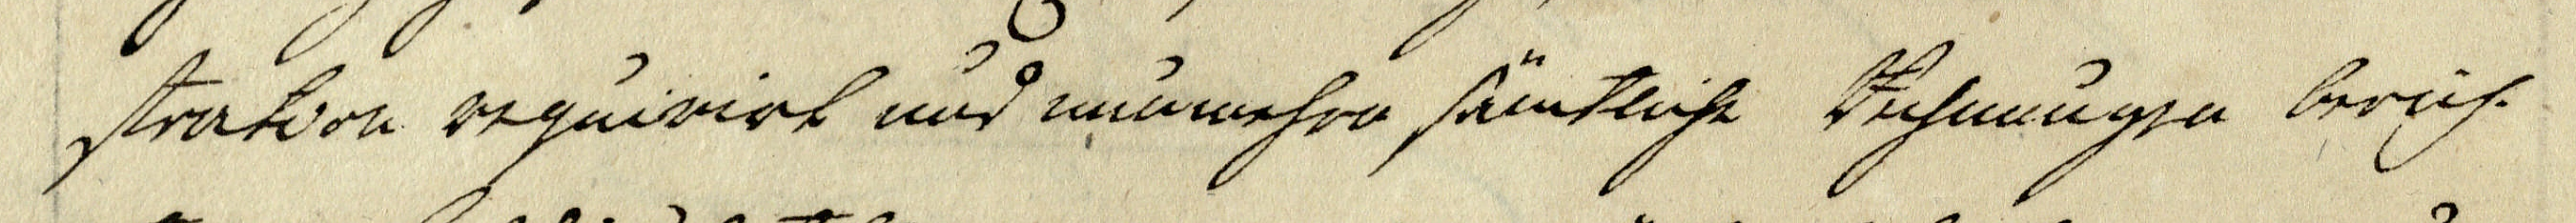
stration requirirt und nunmehro sämtliche Rechnungen berich¬
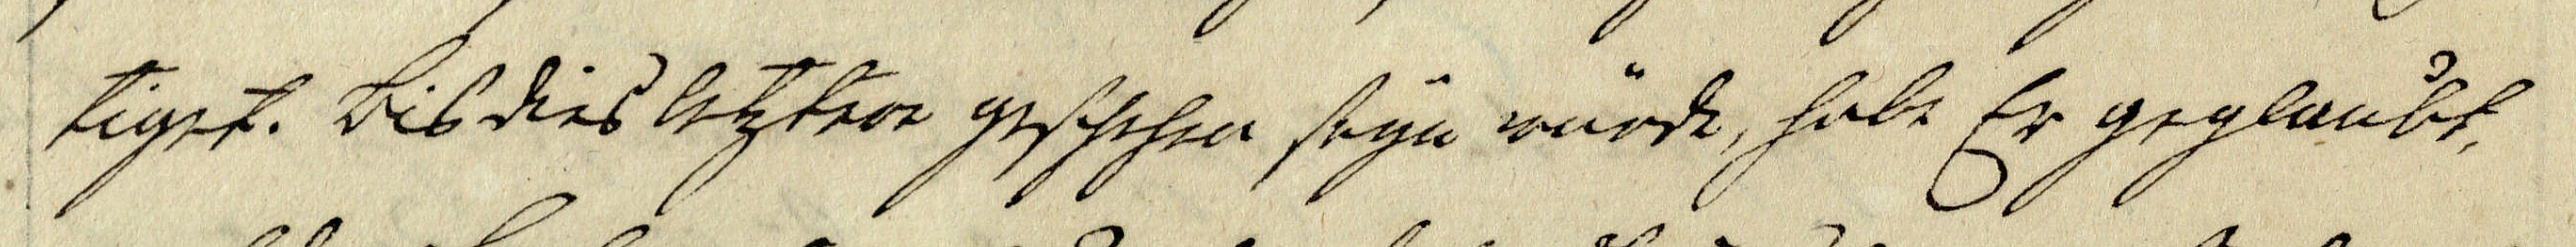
tiget. Bis dies letztere geschehen seÿn würde, habe Er geglaubt,
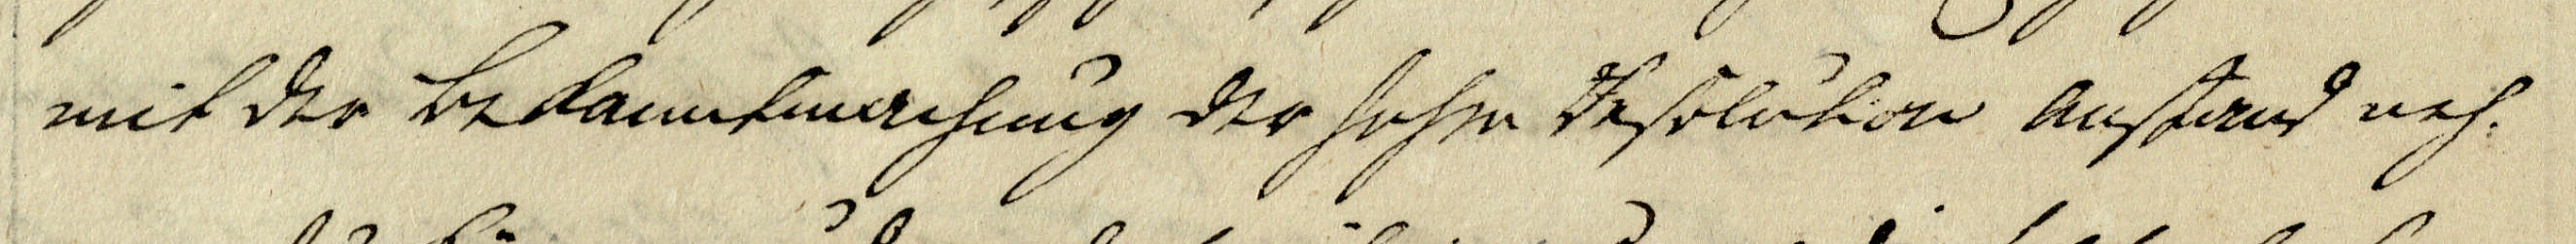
mit der Bekanntmachung der hohen Resolution Anstand neh¬
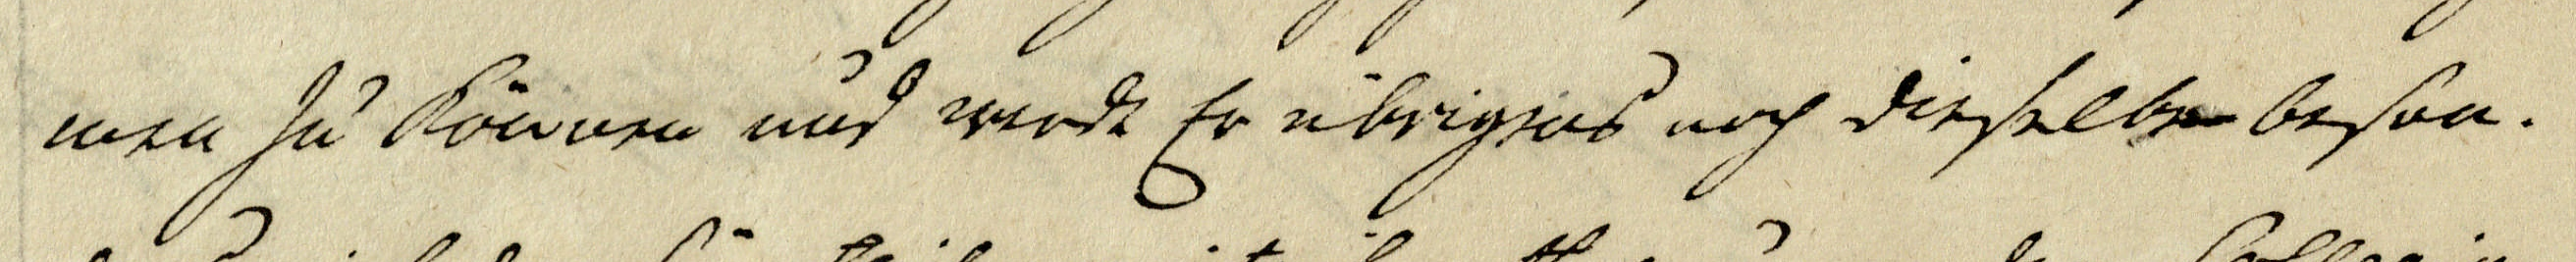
men zu können und werde Er übrigens noch dieselbe beson¬
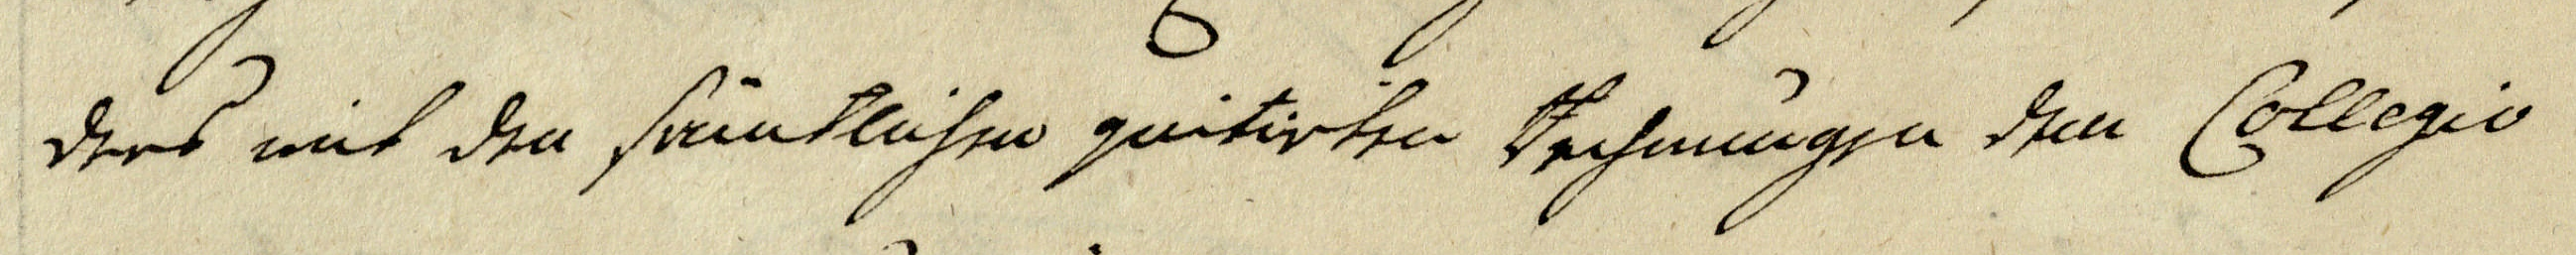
ders mit den sämtlichen quitirten Rechnungen dem Collegio
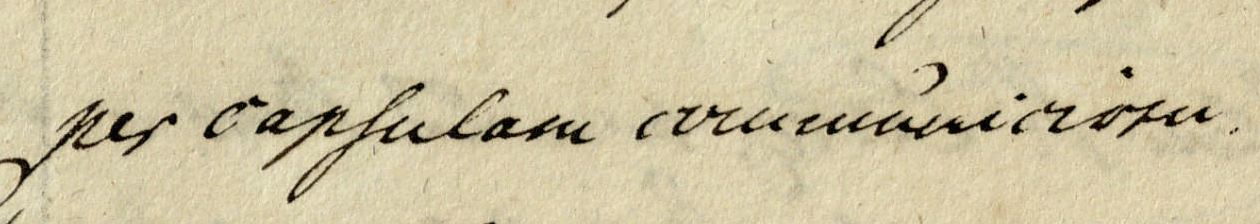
per Capsulam communiciren.
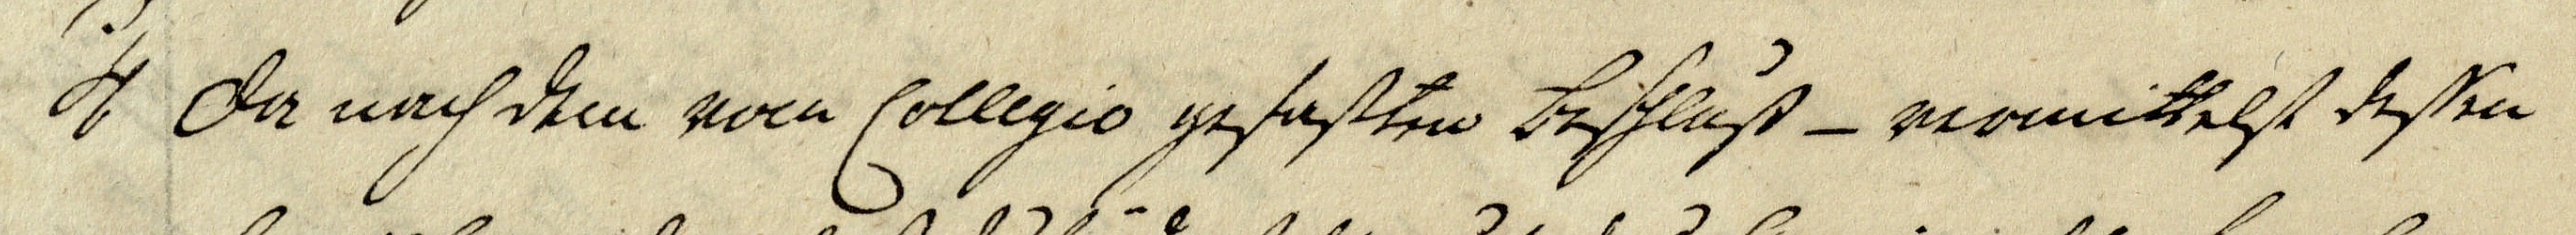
4 Da nach dem vom Collegio gefaßten Beschluß - vermittelst dessen
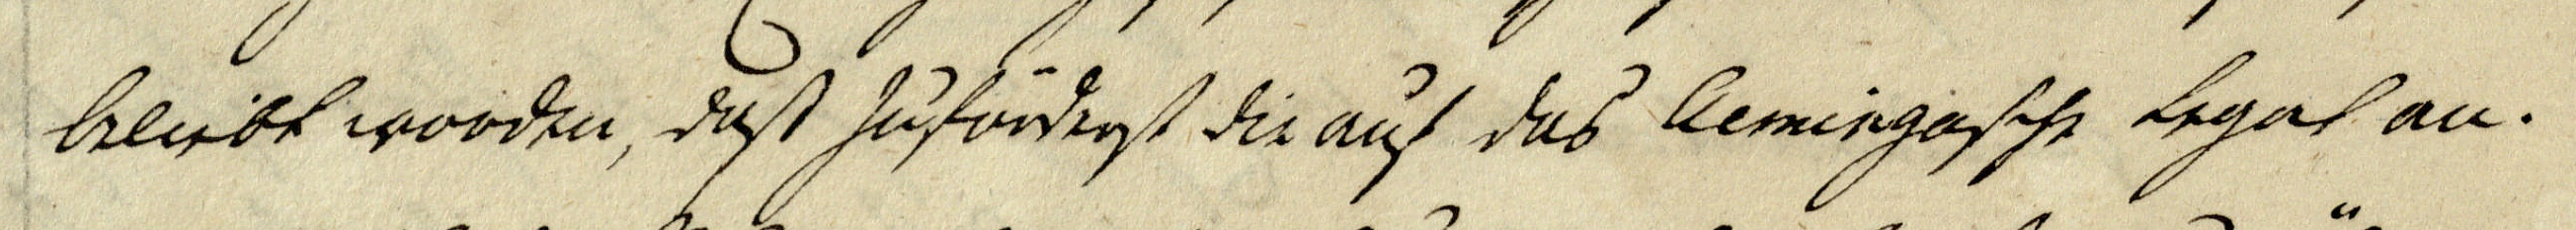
beliebt worden, daß zuförderst die auf das Aemingasche Legat an¬
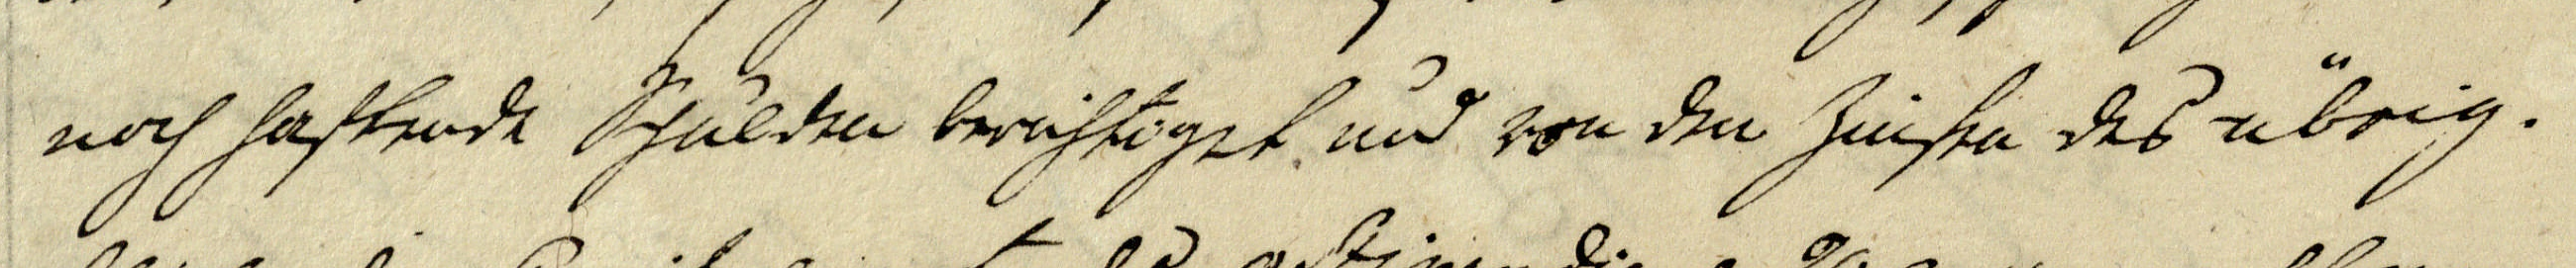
noch haftende Schulden berichtiget und von den Zinsen des übrig¬
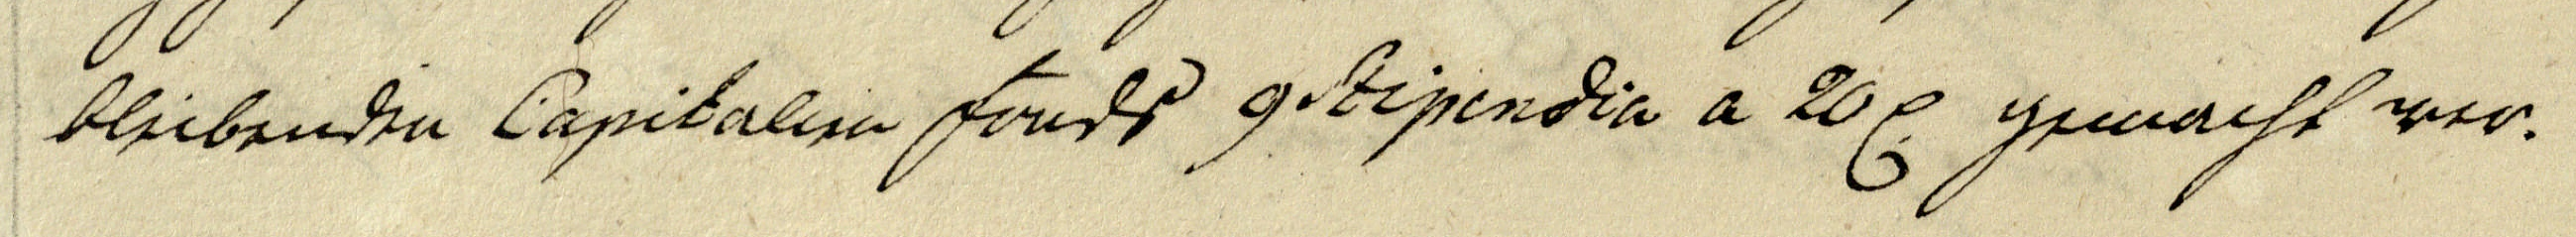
bleibenden Capitalien Fonds 9 Stipendio a 20 l. gemacht wer¬
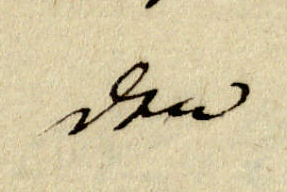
den
